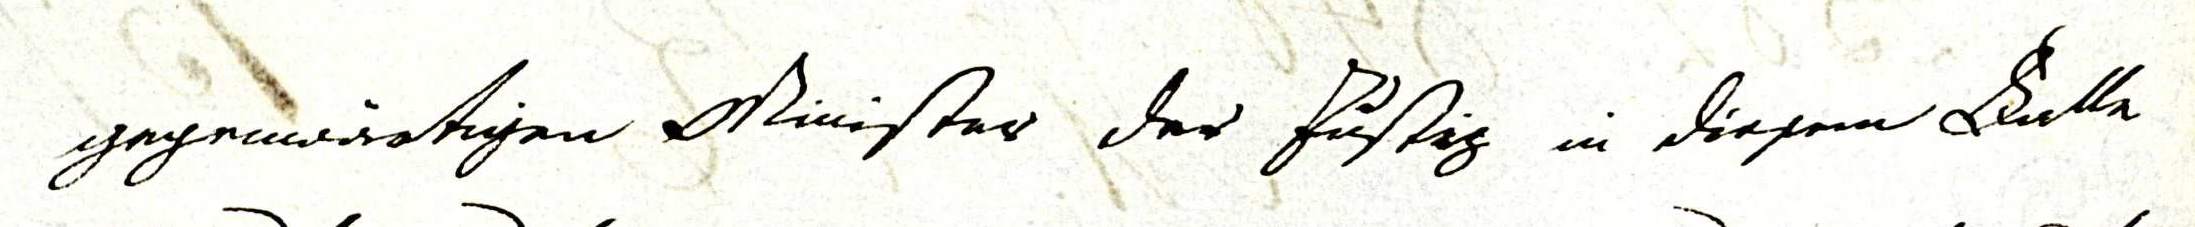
gegenwärtigen Minister der Justiz in diesem Falle
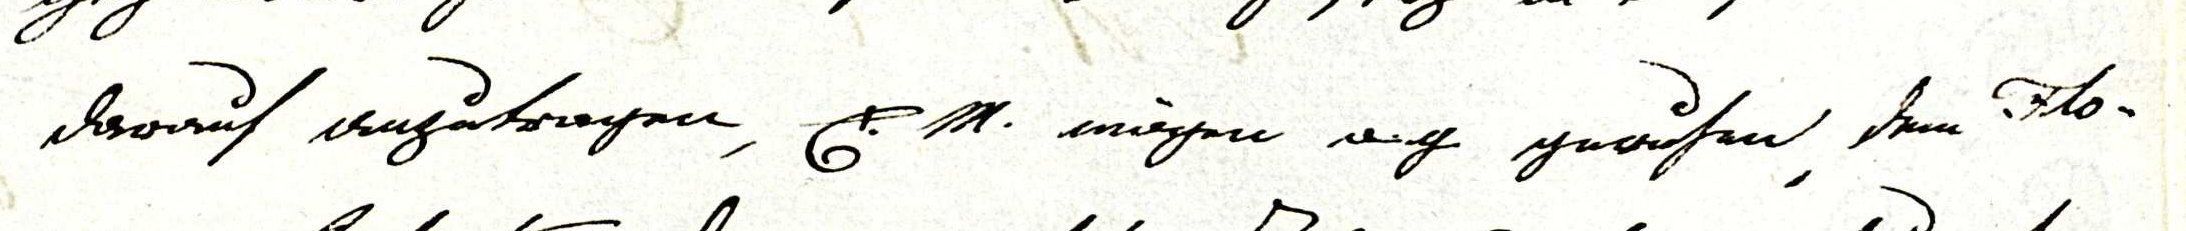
darauf anzutragen, E.M. mögen auch geruhen, dem Flo¬
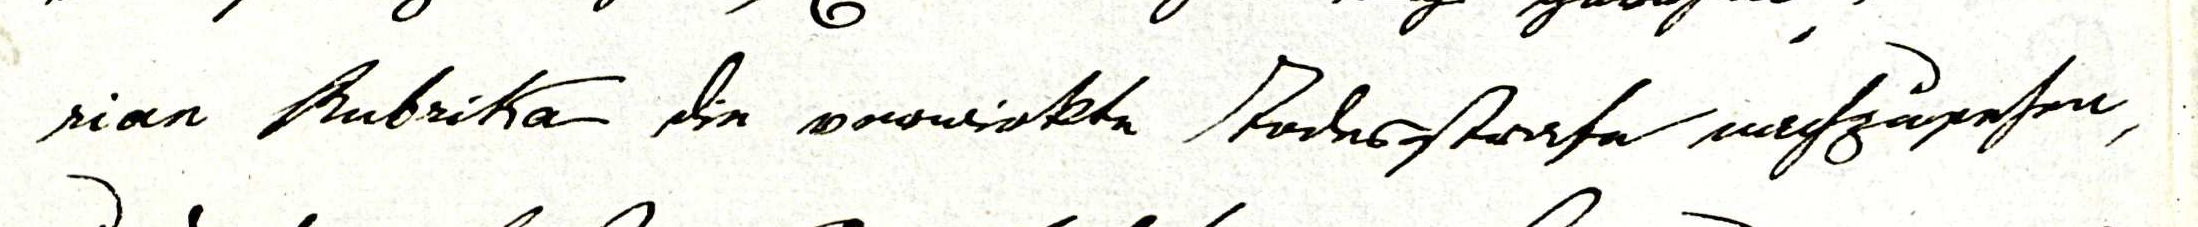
rian Rubrika die verwirkte Todesstrafe nachzusehen,
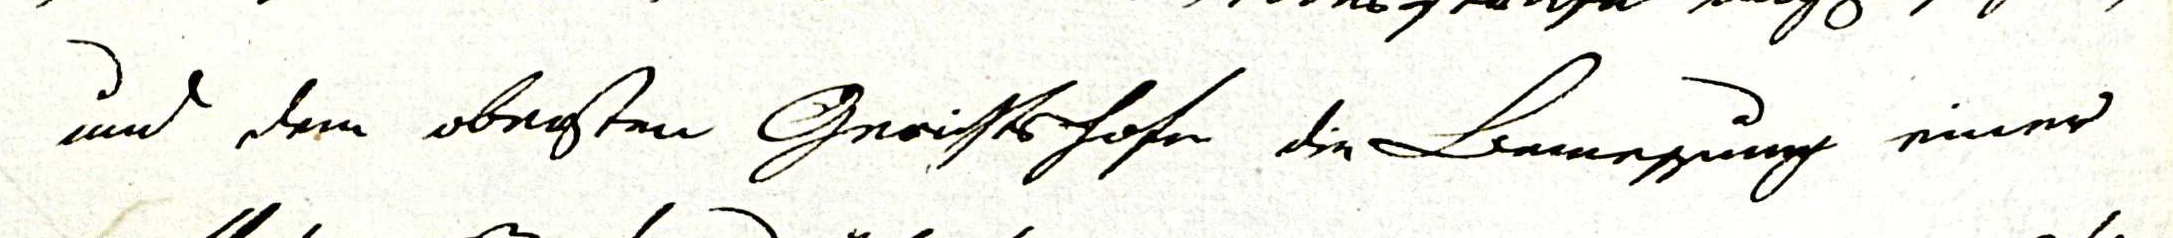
und dem obersten Gerichsthofe die Bemessung einer
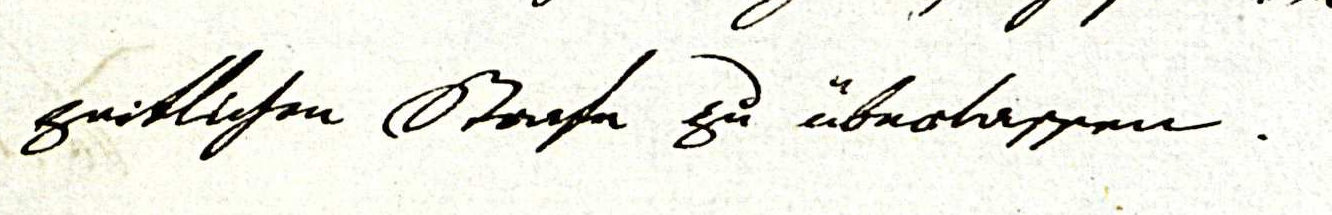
zeitlichen Strafe zu überlassen.
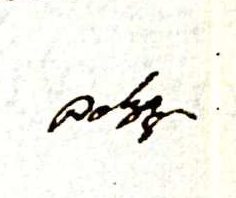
Bolza
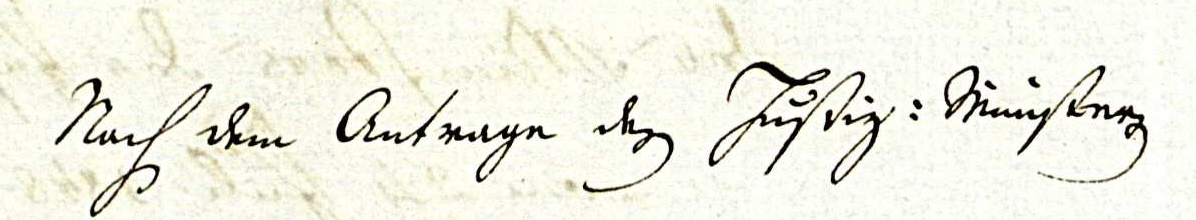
Nach dem Antrage des Justiz-Ministers
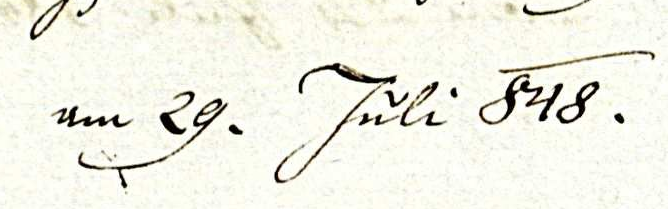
Am 29. Juli [1]848
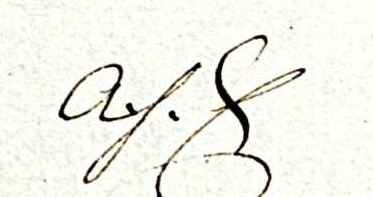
AhE
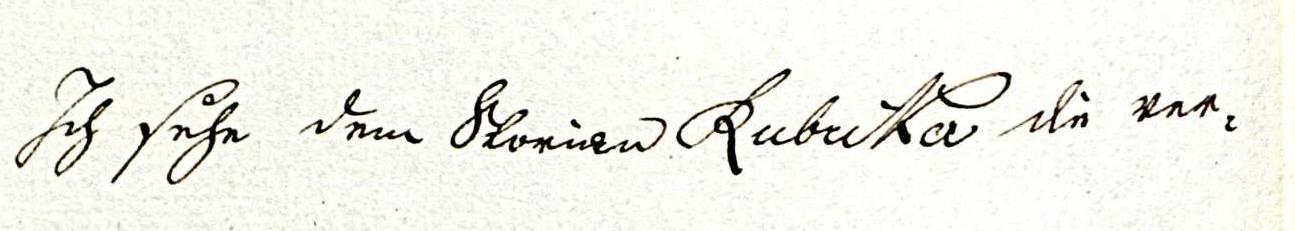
Ich sehe dem Florian Rubrika die ver¬
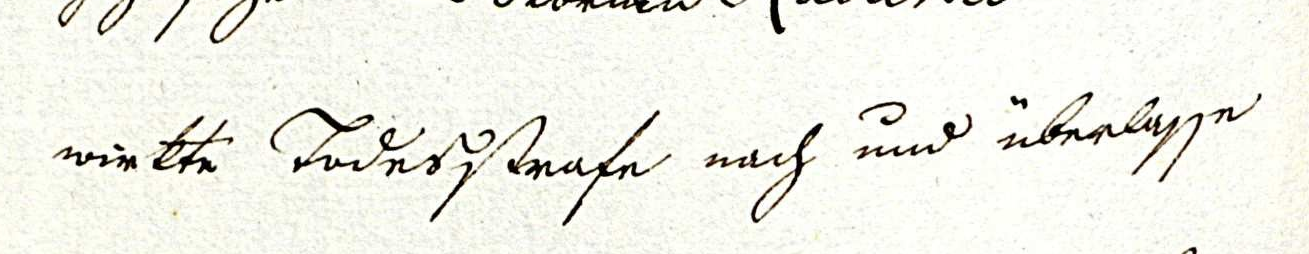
wirkte Todesstrafe nach und überlasse
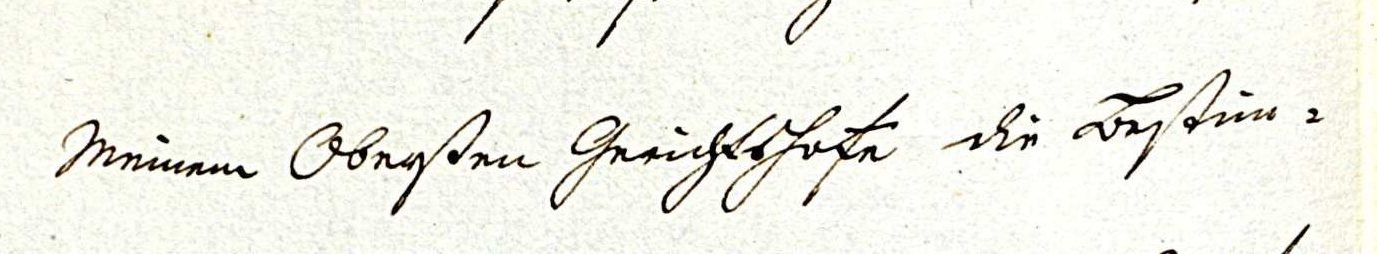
Meinem Obersten Gerichtshofe die Bestim¬
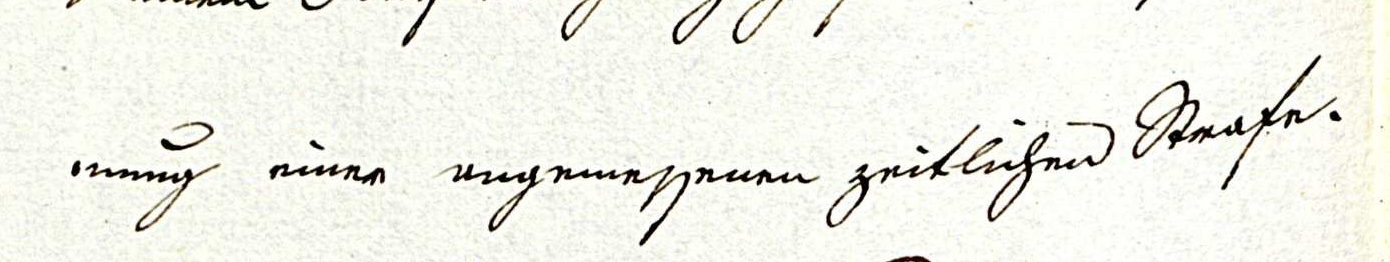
mung einer angemessenen zeitlichen Strafe.
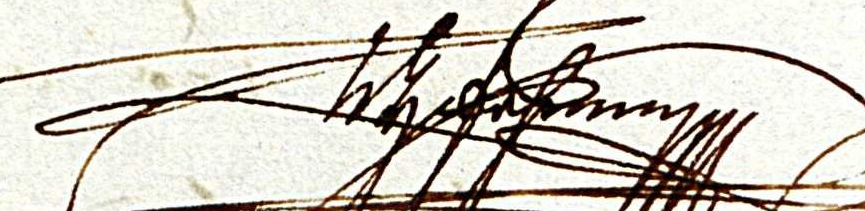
Erz. Johann
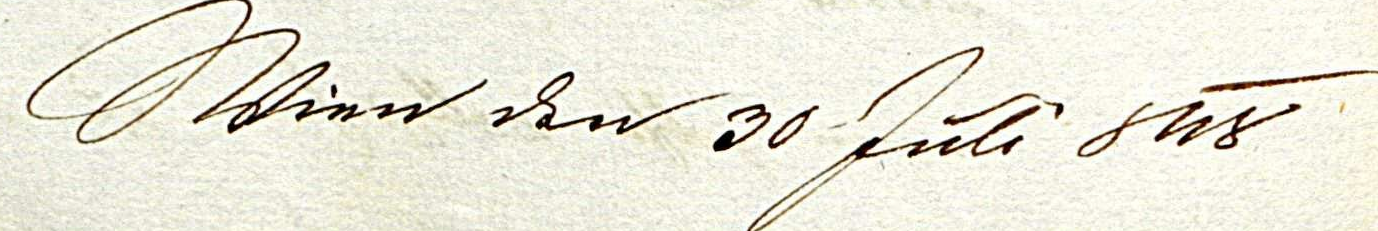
Wien den 30 Juli [1]848
